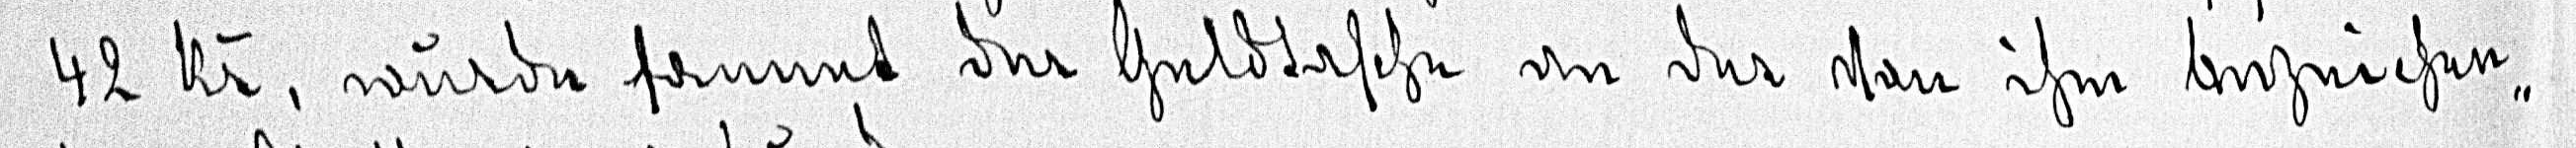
42 Kr., wurde sammt der Geldtasche an der von ihm bezeichne¬
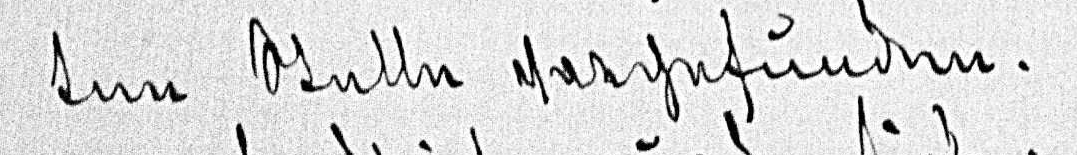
ten Stelle vorgefunden.
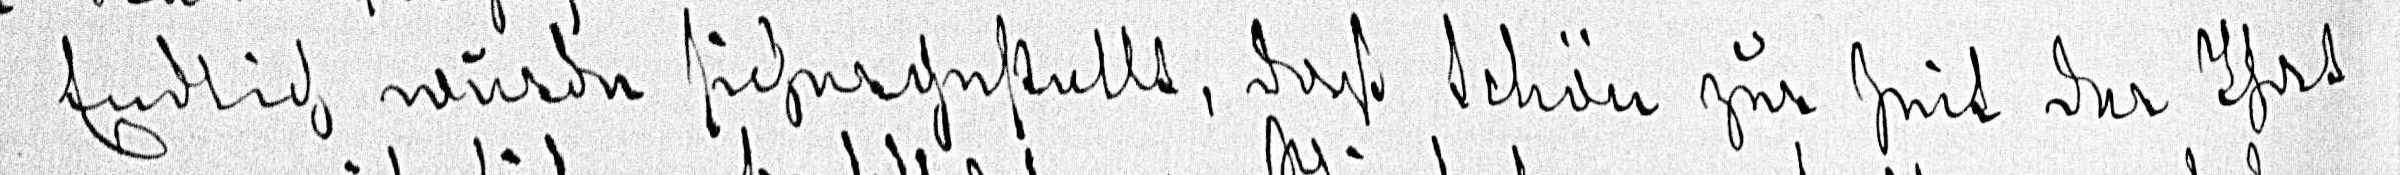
Endlich wurde sichergestellt, daß Schön zur Zeit der That
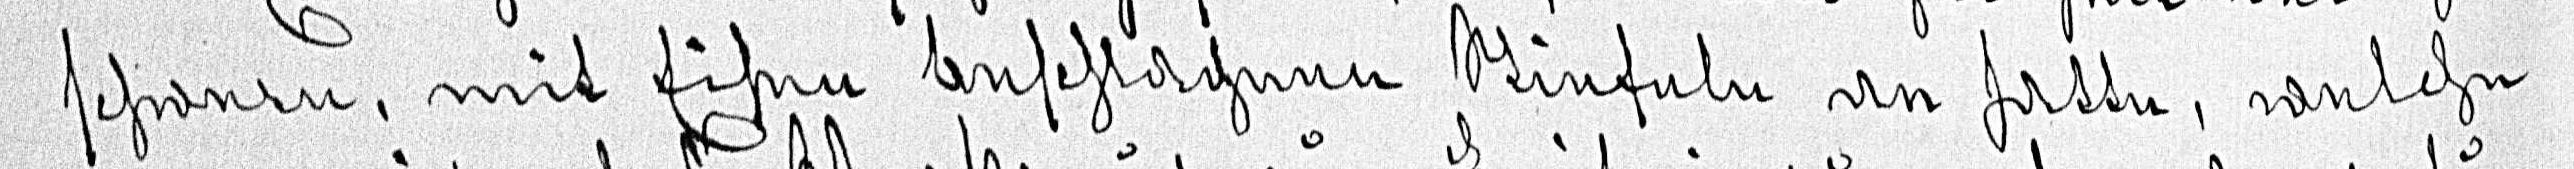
schwere, mit Eisen beschlagene Stiefeln an hatte, welche
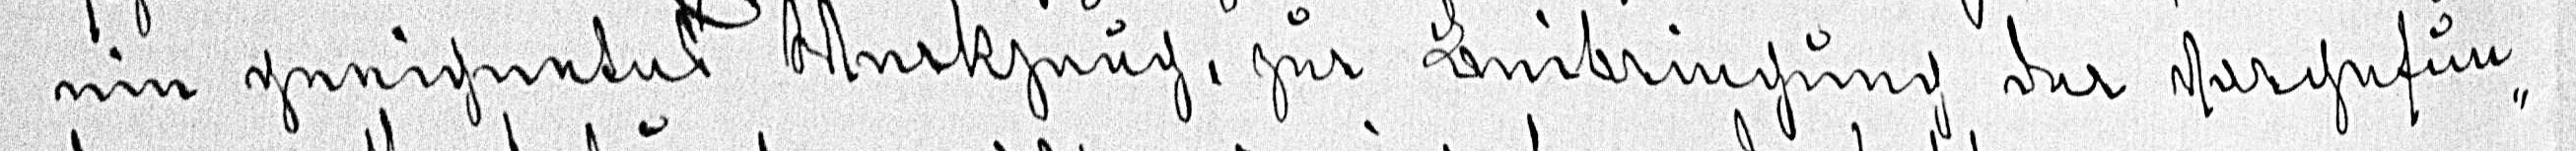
ein geeignetes Werkzeug, zur Beibringung der vorgefun¬
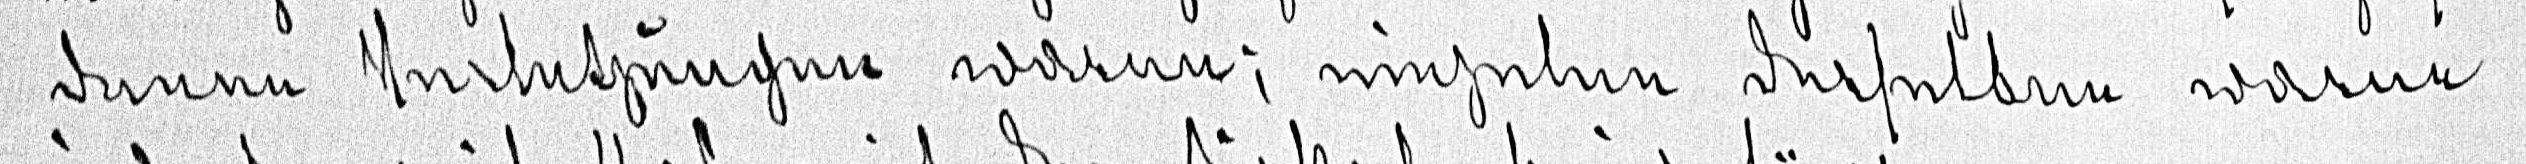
denen Verletzungen waren; einzelne derselben waren
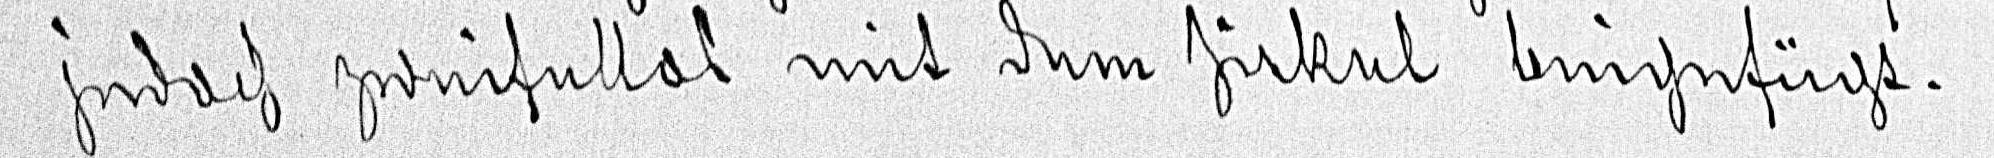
jedoch zweifellos mit dem Zirkel beigeführt.
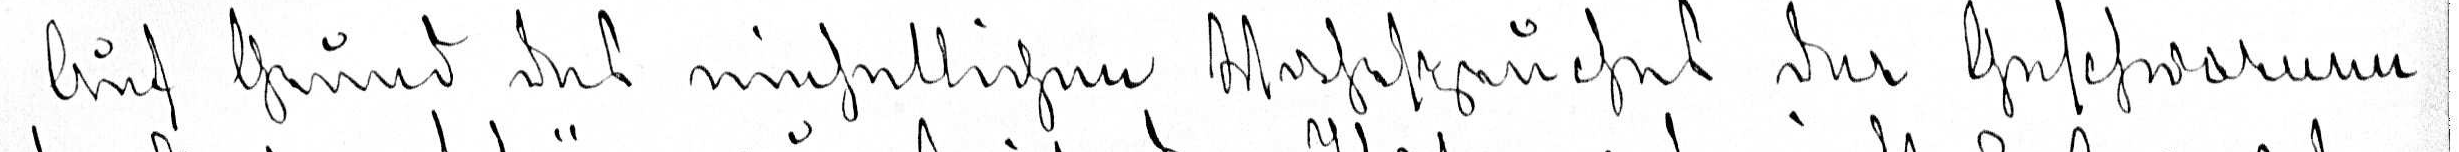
Auf Grund des einhelligen Wahrspruches der Geschworenen
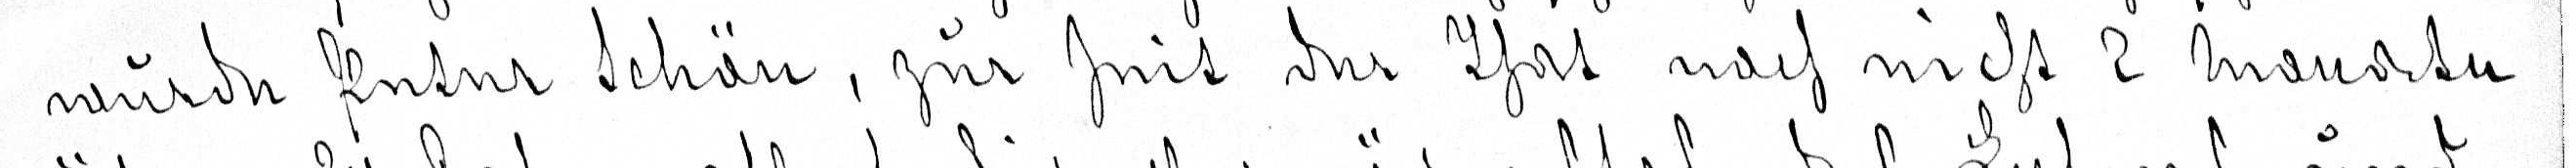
wurde Peter Schön, zur Zeit der That noch nicht 2 Monate
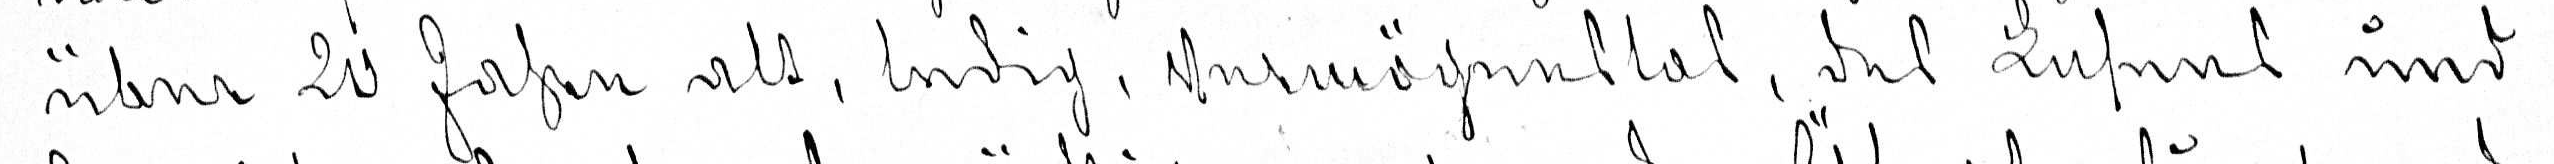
über 20 Jahre alt, ledig, vermögenslos, des Lesens und
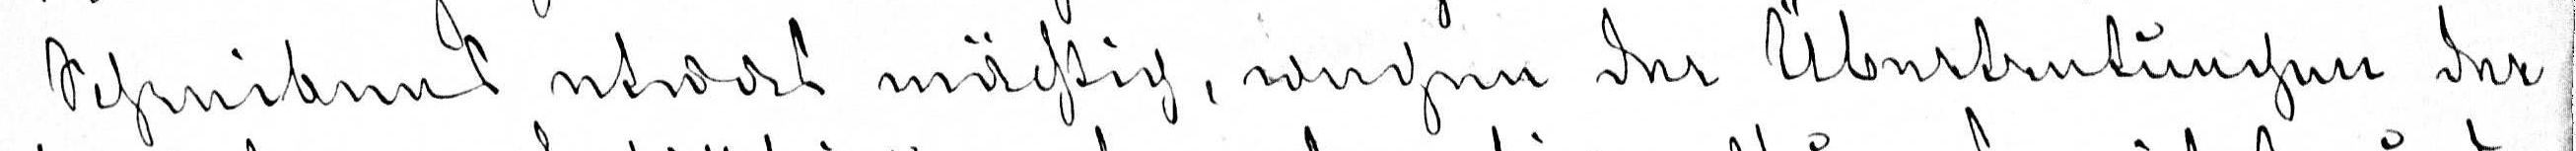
Schreibens etwas mächtig, wegen der Übertretungen der
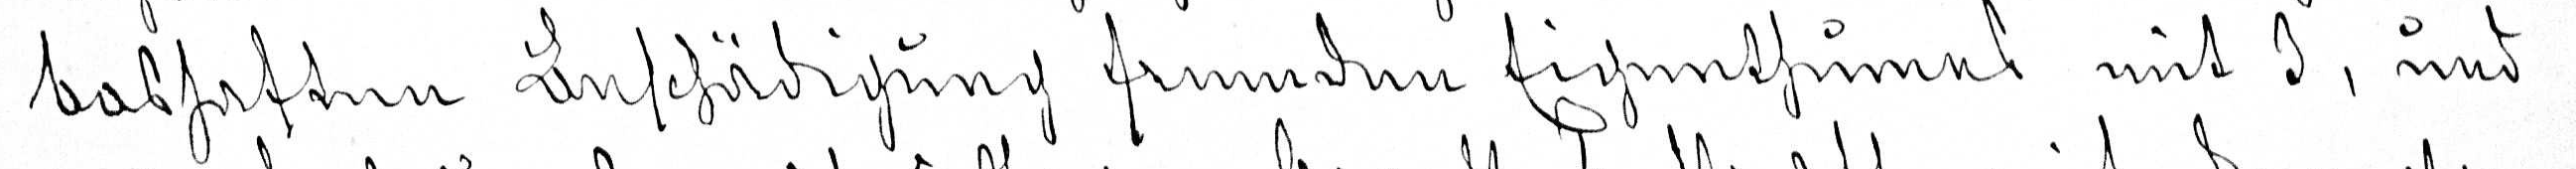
boshaften Beschädigung fremden Eigenthumes mit 3, und
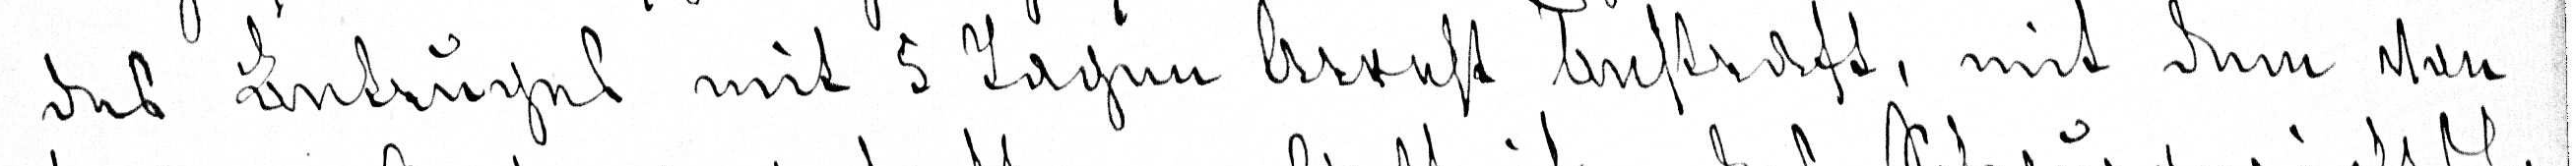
des Betruges mit 5 Tagen Arrest bestraft, mit dem von
